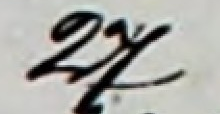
27
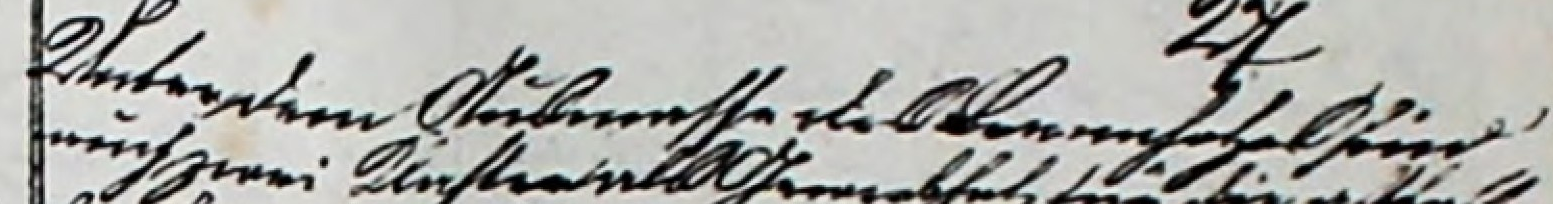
Unterdem Ausmassee dies Bennaholzas sind
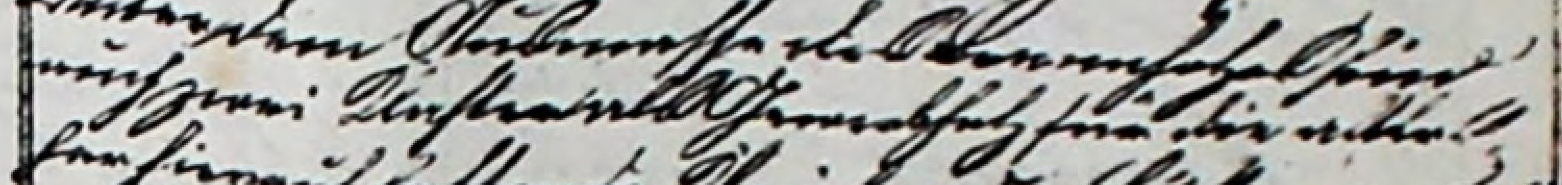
auchzwei Unsterals Gemenholz für die acker
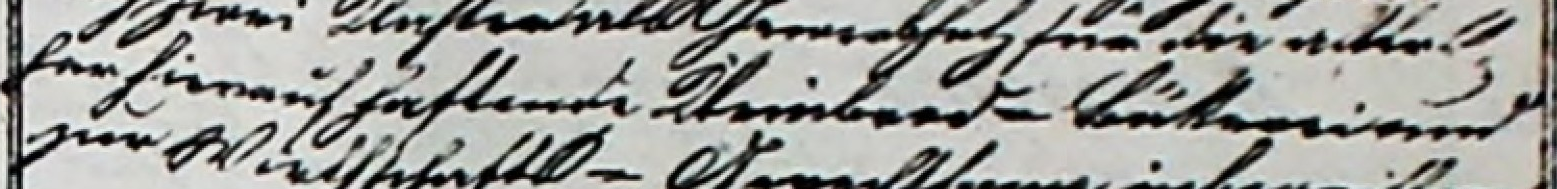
her hierauf haftende Kleinberd = Bäkerei und
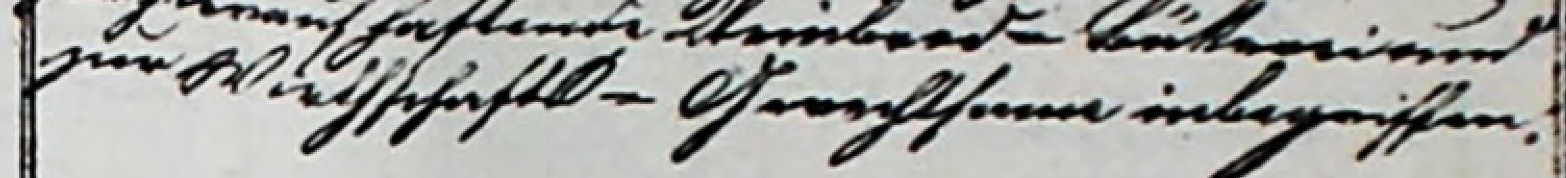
zur Wirthschafts = Gerechtsann inbegriffen
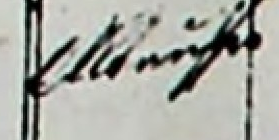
A???uss?
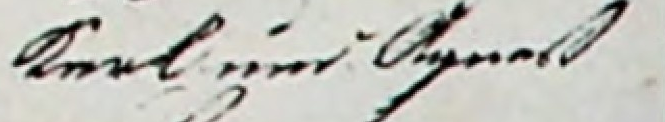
Karl und Agnes
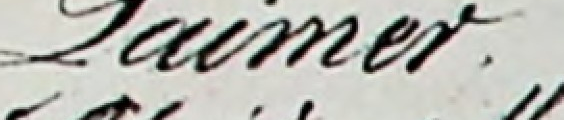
Laimer
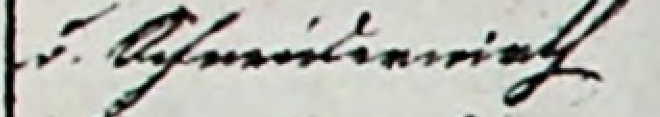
v. Schneiderwirth
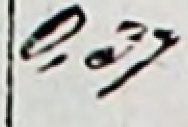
0,37
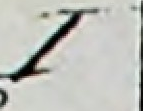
I
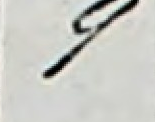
9
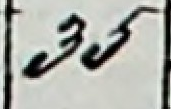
35
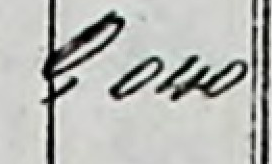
0,040
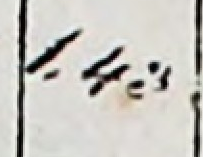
1,43
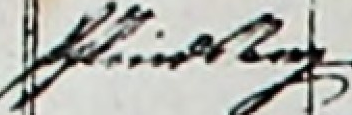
Pflindsberg
